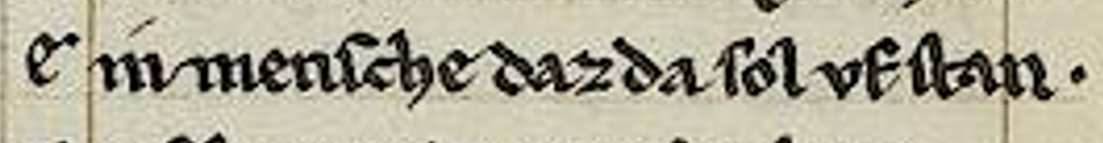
Ein menſche daz da ſol vf ſtan.
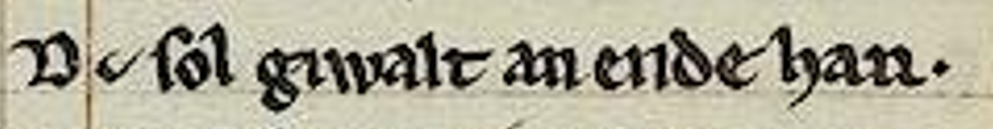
Daz ſol giwalt an ende han.
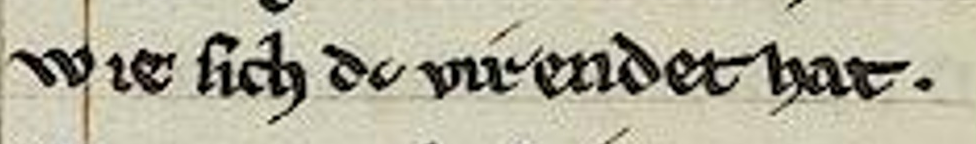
Wie ſich d(az) vir endet hat.
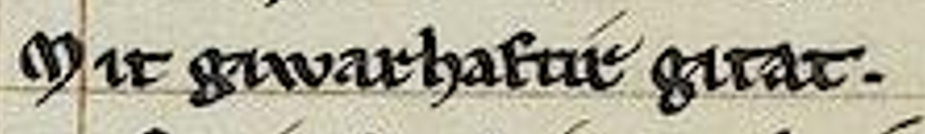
Mit giwarhaftir gitat.
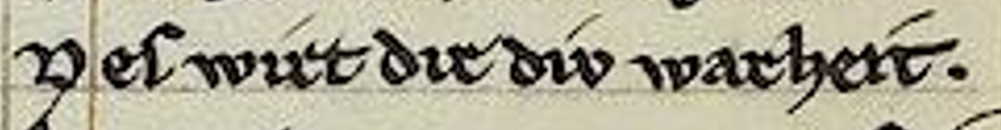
Deſ wirt dir div warheit.
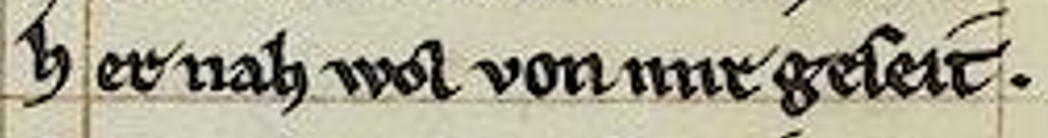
Her nah wol von mir geſeit.
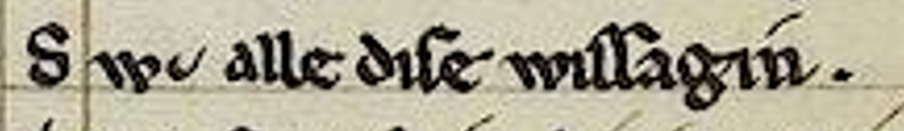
Sw(az) alle diſe wiſſagin.
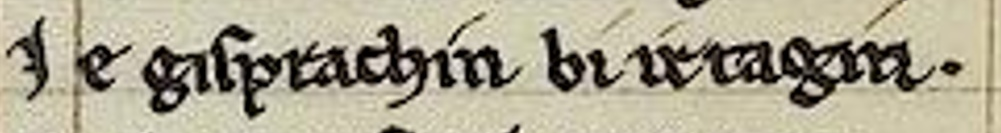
Ie giſprachin bi ir tagin.
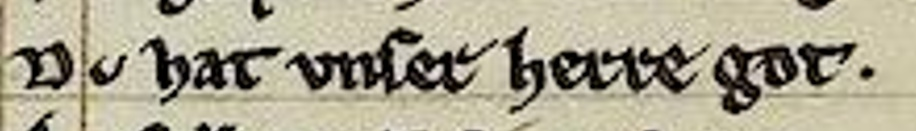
D(az) hat vnſer herre got.
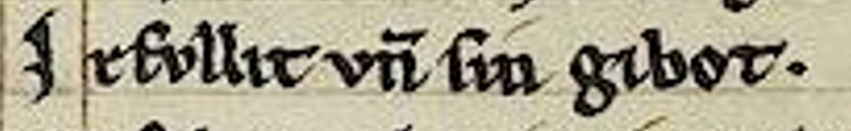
Irfvllit vn(d) ſin gibot.
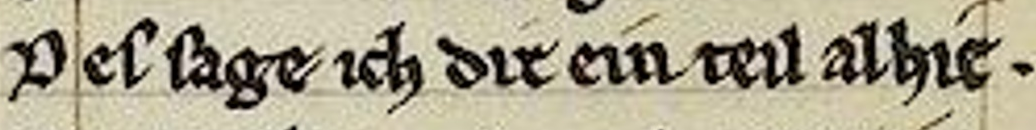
Deſ ſage ich dir ein teil alhie.
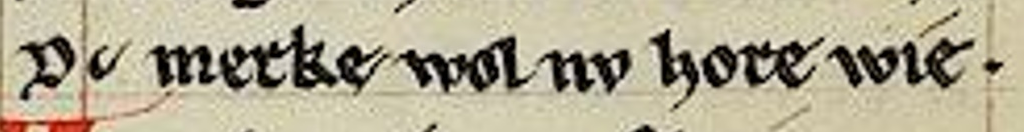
D(az) merke wol nv hore wie.
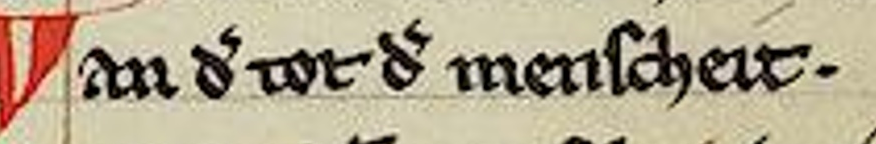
**Wan d(er) tot d(er) menſcheit.
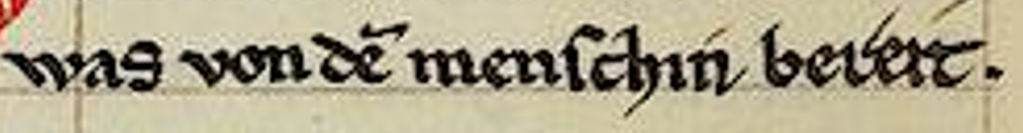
Was von de(n) menſchin bereit.
